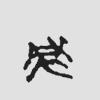風
